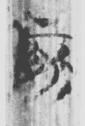所
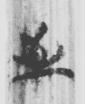至
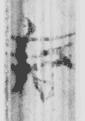者
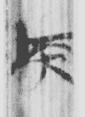侯
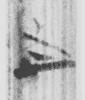之
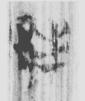邦
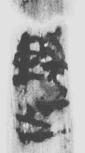{車㞷止}
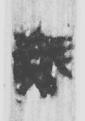者
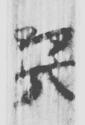巽
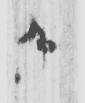千
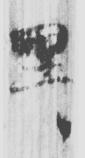里
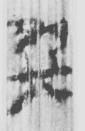巽
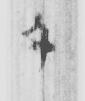千
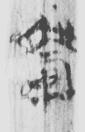{舛亼几車}
